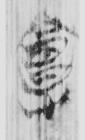憎
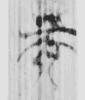而
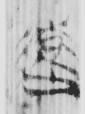遠
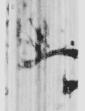之
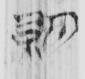則
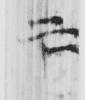下
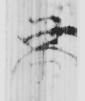不
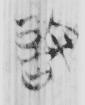敢
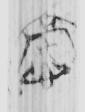{京心}
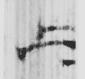上
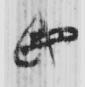母
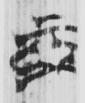亞
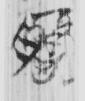䌛
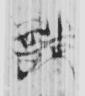{言川又}
